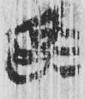爲
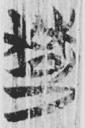楚
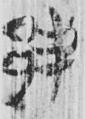邦
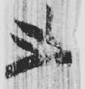之
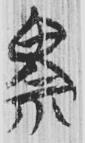○（鬼）
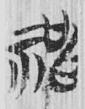神
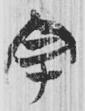宔（主）
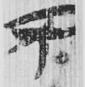不
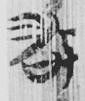敢
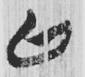㠯（以）
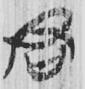君
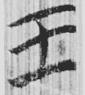王
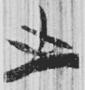之
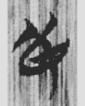身
